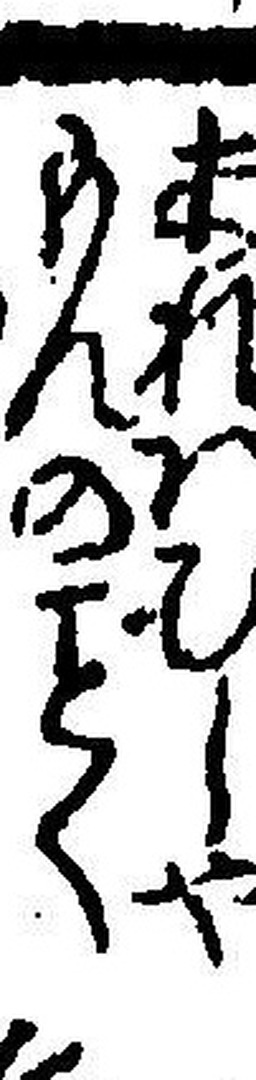もんのごとく
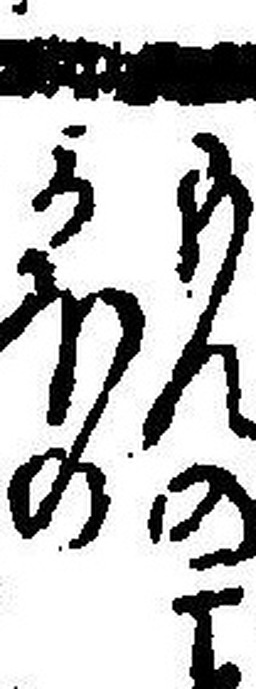かほの
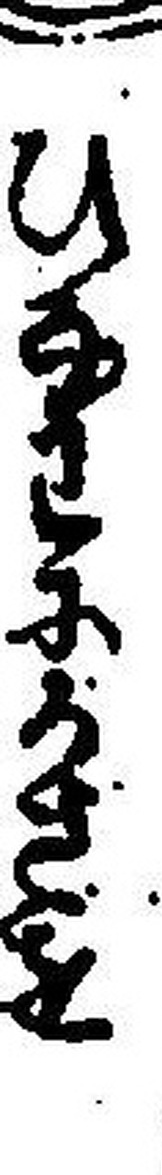ひなわにかさを
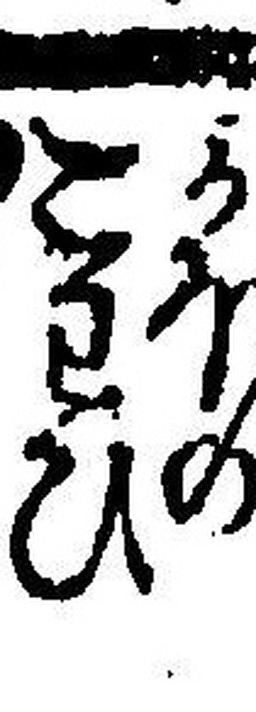こわひ
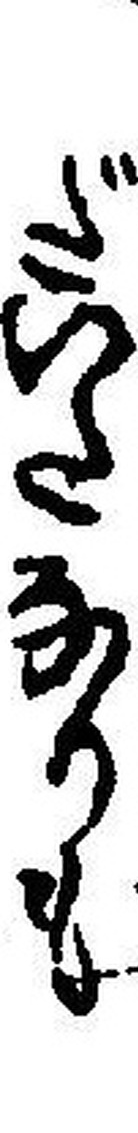だいたなりも
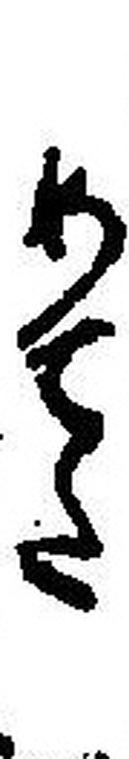めてた
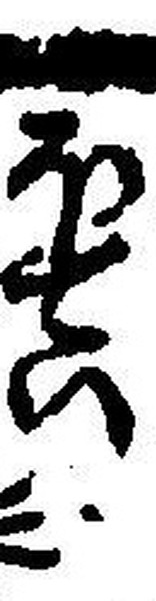ほてい
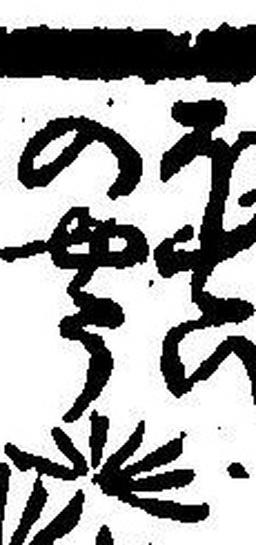のやう
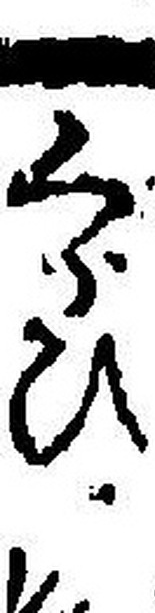くらひ
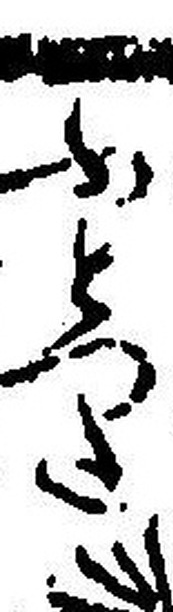ふとつた
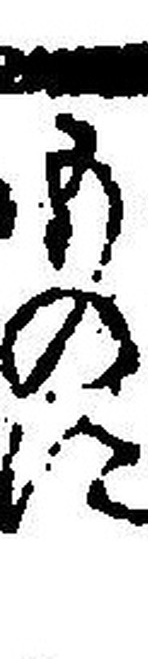ものに
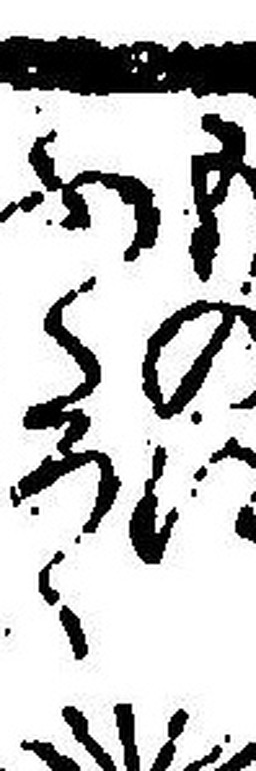ふくろく
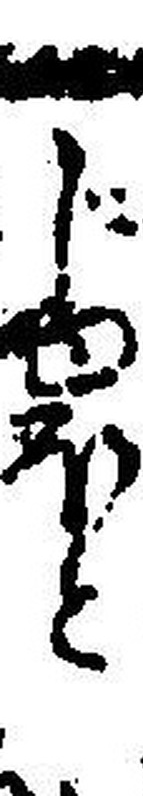じゆほと
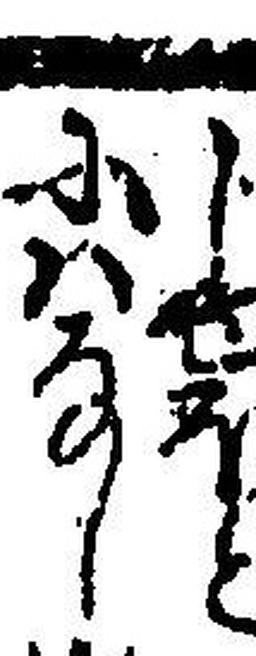にはなし
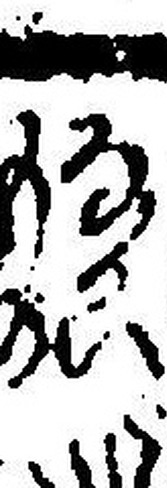なかい
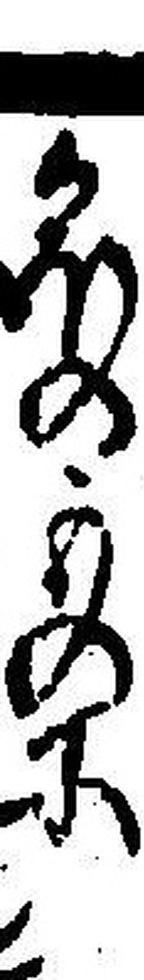かほのものに
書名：徳若水縁起金性 / 樹下石上作
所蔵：東京大学総合図書館 General Library in the University of Tokyo, JAPAN
